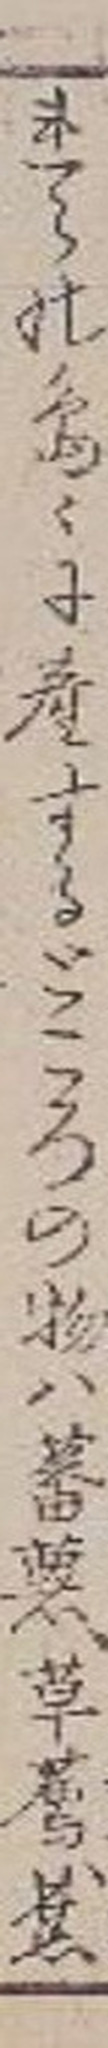れらの島々に、産するところの物は、蕃薯、草薦、蕉
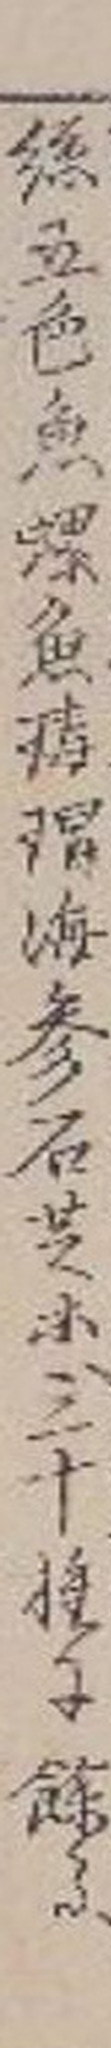絲、五色魚、螺魚、瑇瑁、海参、石芝等、三十種に余る、

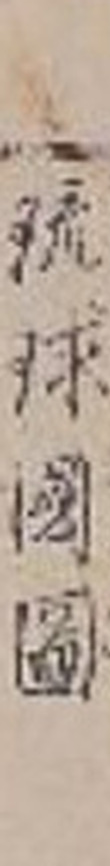琉球国図

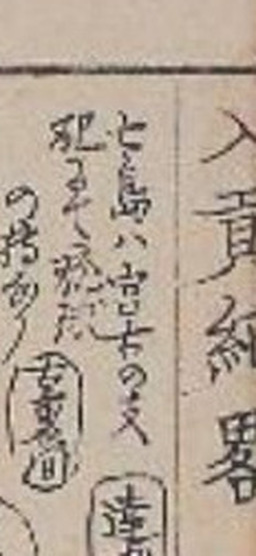七島は宮古の支
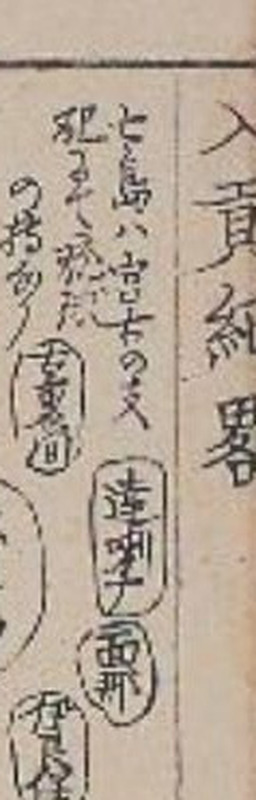七島は宮古の支
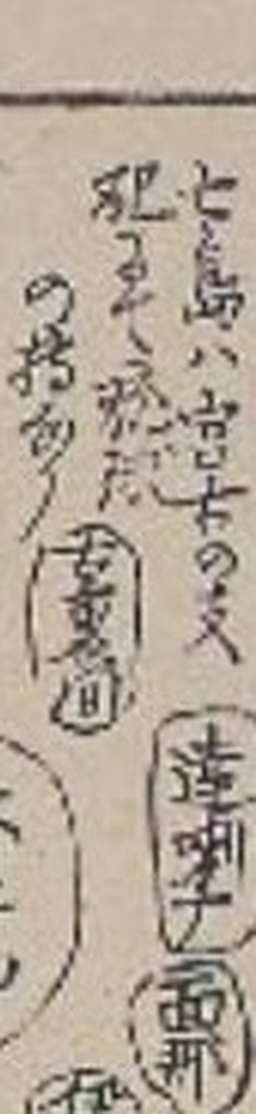の持なり
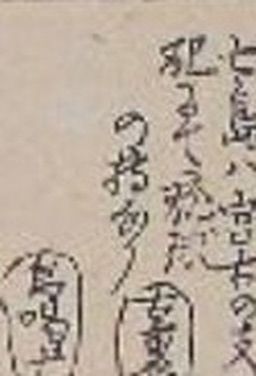の持なり
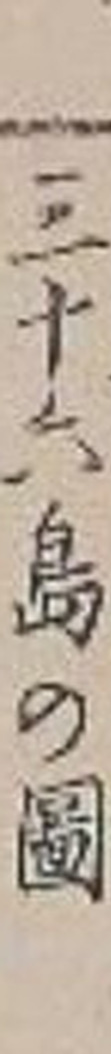三十六島の図
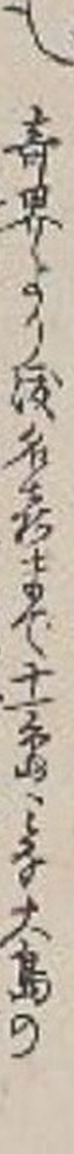奇界より渡名喜まで十一島みな大島の
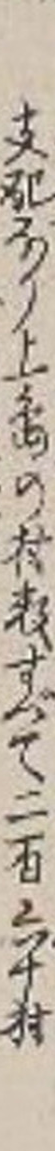支配なり上島の村数すべて二百六十村
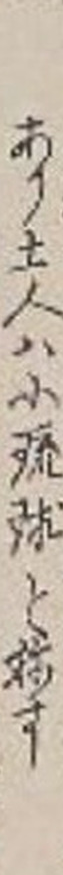あり土人は小琉球と称す
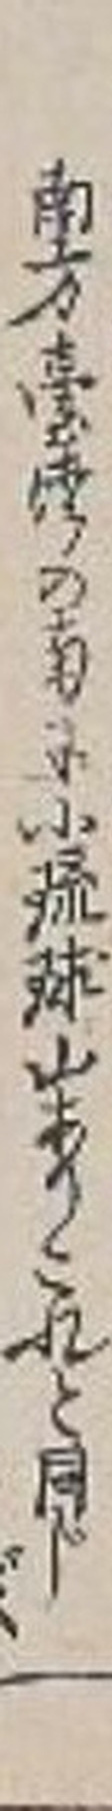南方台陸の南に小琉球山ありこれと同じ
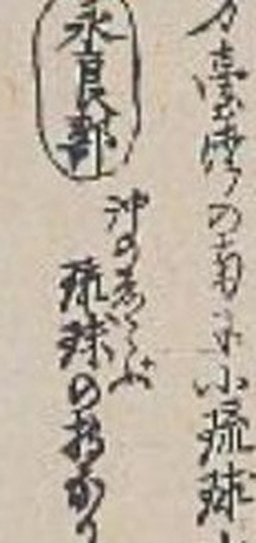沖のゑらぶ
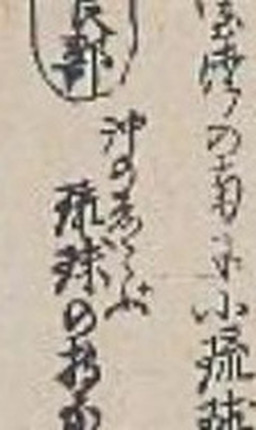沖のゑらぶ
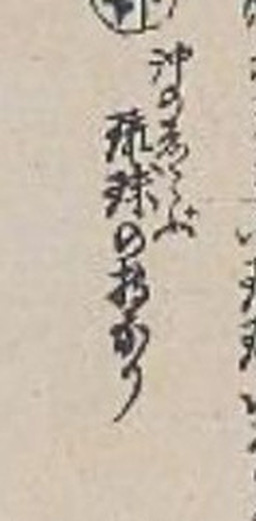琉球の持なり
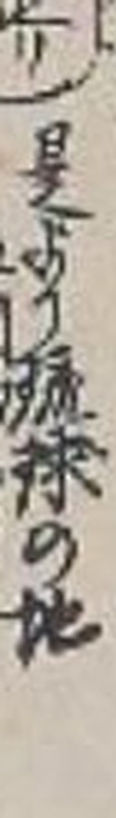是より琉球の地
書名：琉球入貢紀略
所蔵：University of the Ryukyus Library
